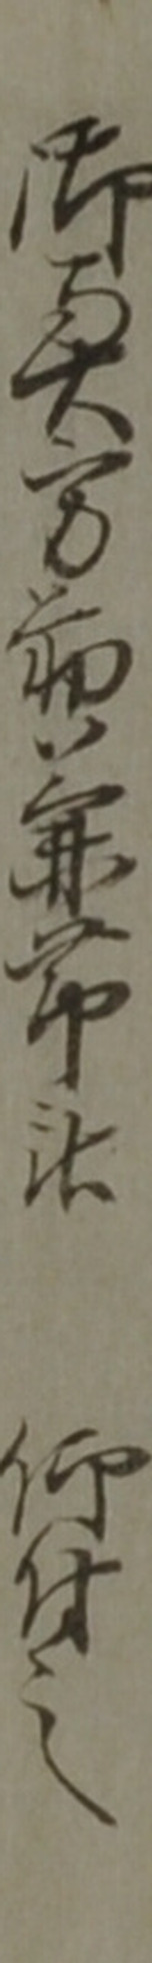御奥方勤兼帯被仰付之
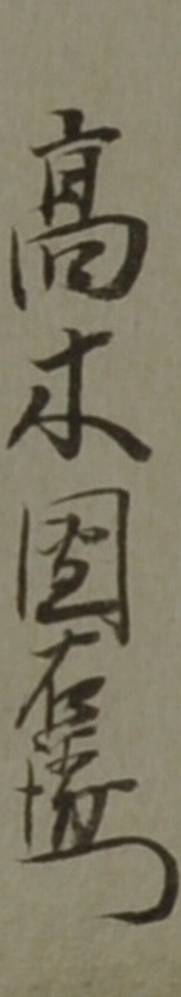高木団右衛門
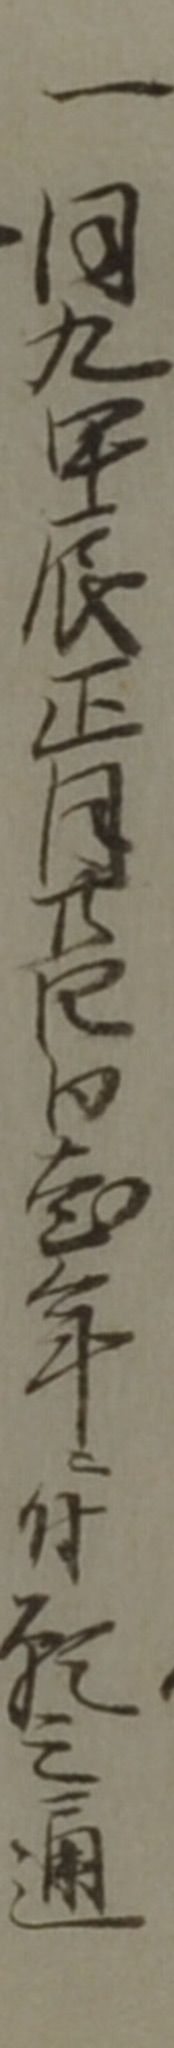一同九甲辰正月廿四日老年ニ付願之通
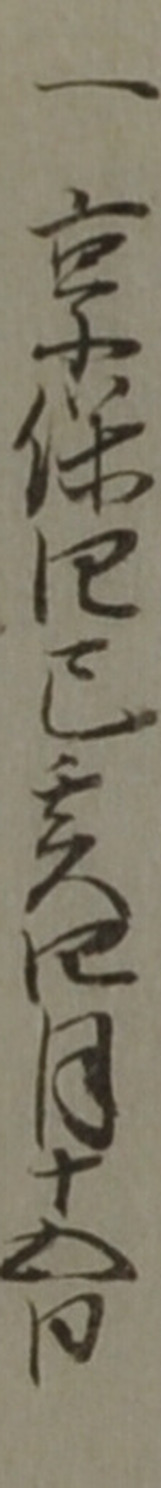一享保四己亥四月十五日
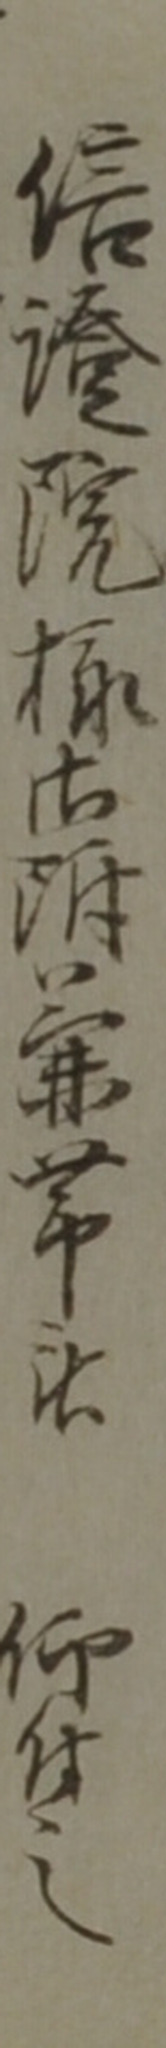信証院様御附兼帯被仰付之
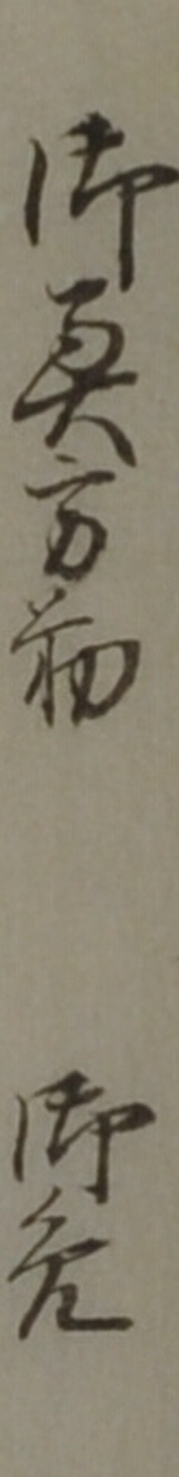御奥方勤御免
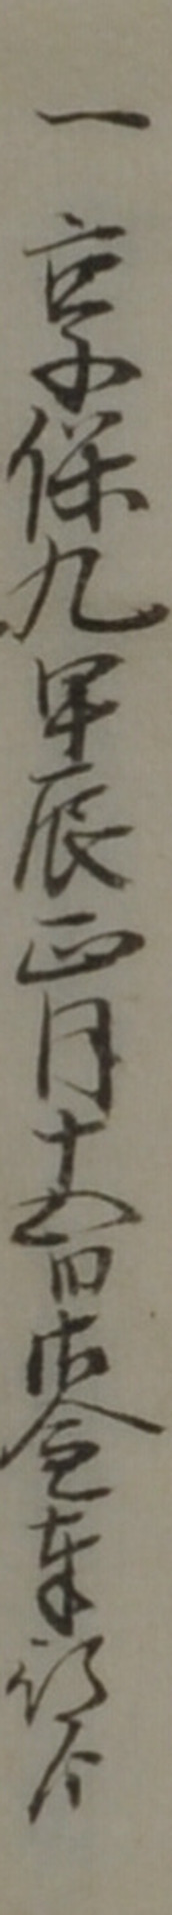一享保九甲辰正月十五日御金奉行ゟ
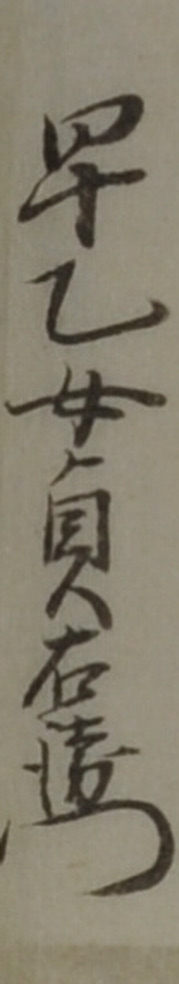早乙女貞右衛門
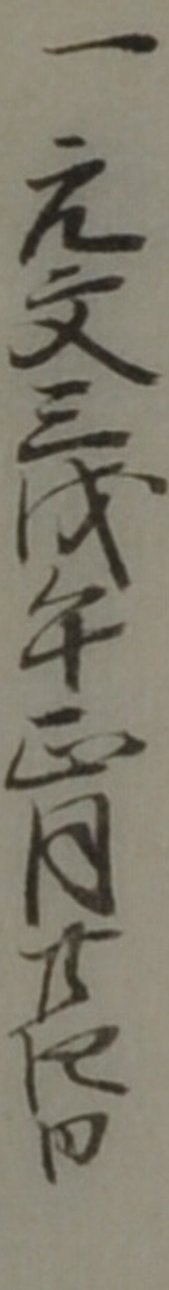一元文三戊午正月廿四日
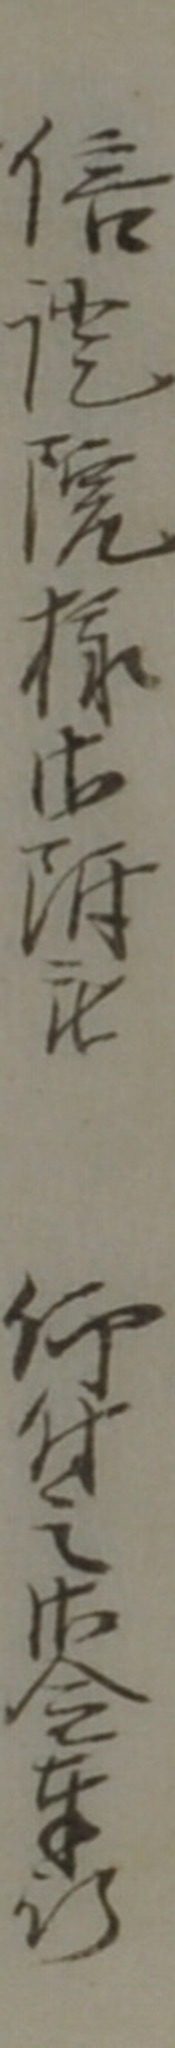信証院様御附被仰付之御金奉行
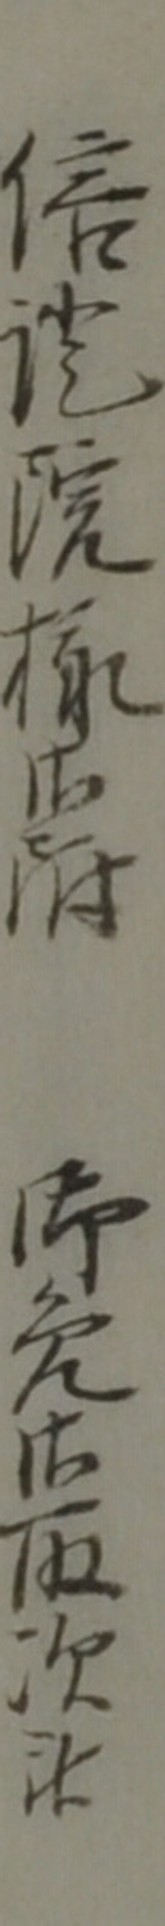信証院様御附御免御取次被
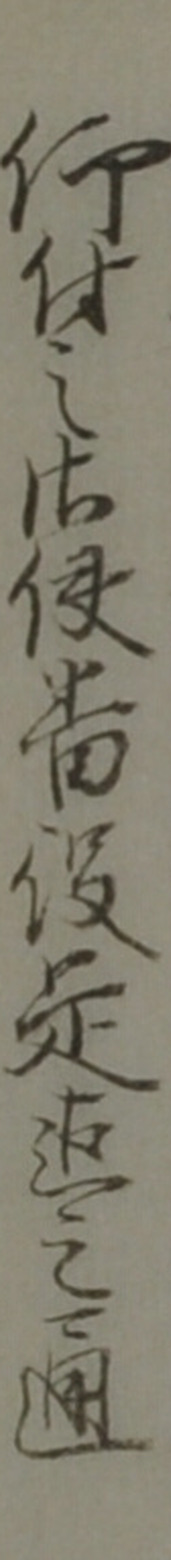仰付之御使番役是迄之通
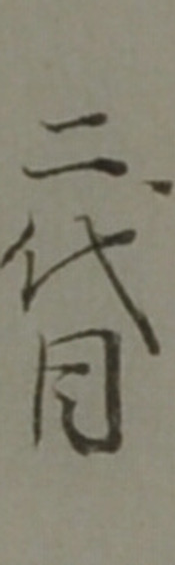二代目
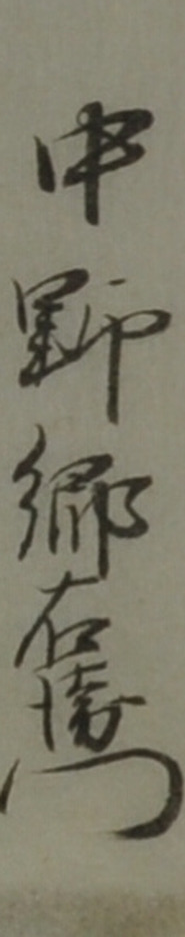中野郷右衛門
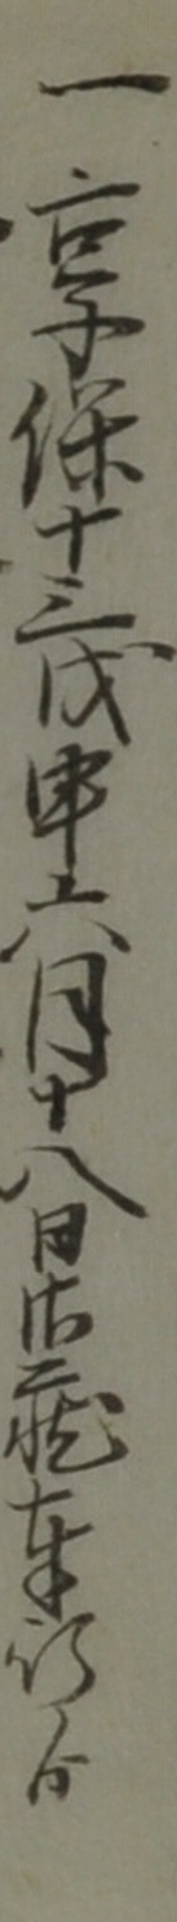一享保十三戊申六月十八日御蔵奉行ゟ
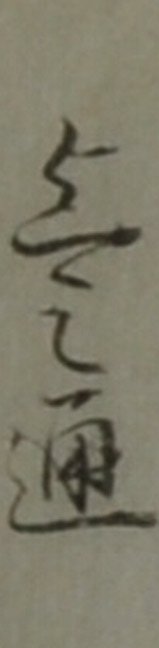迄之通
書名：諸御役代々録（六）
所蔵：伊那市立高遠町図書館・合同会社AMANE
